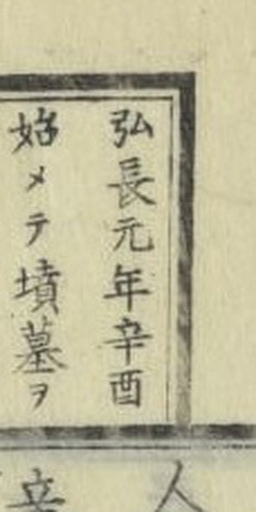弘長元年辛酉
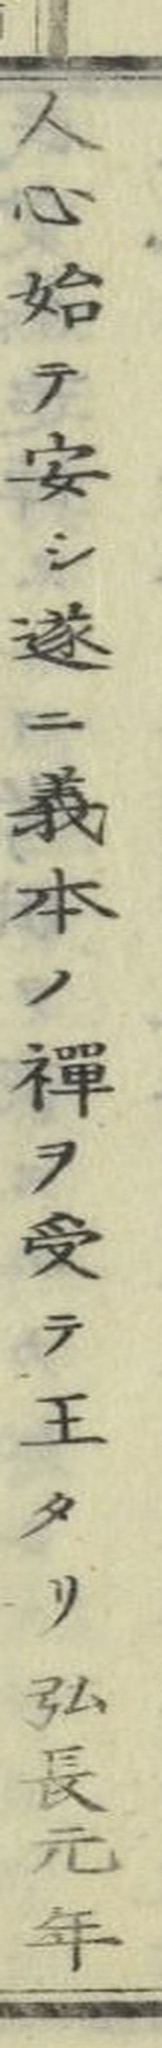人心始テ安シ遂ニ義本ノ禪ヲ受テ王タリ弘長元年
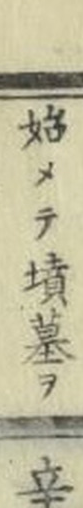始メテ墳墓ヲ
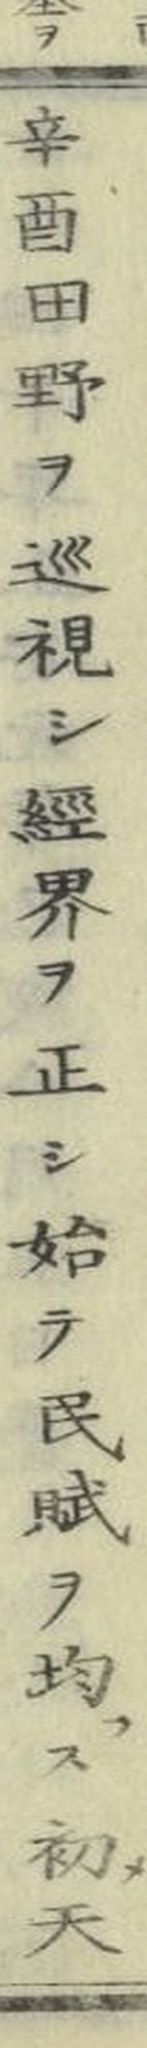辛酉田野ヲ巡視シ經界ヲ正シ始テ民賦ヲ均ス初天
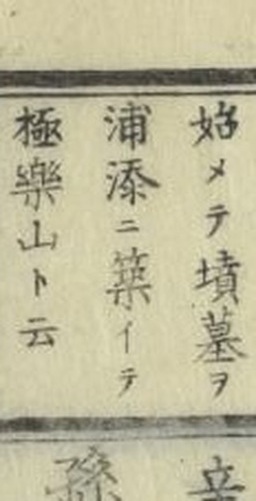浦添ニ築イテ
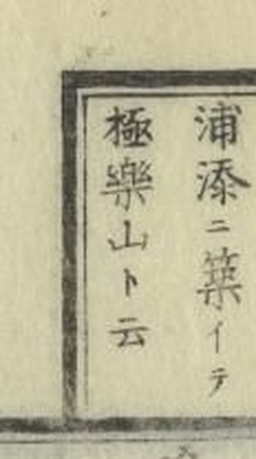極楽山ト云
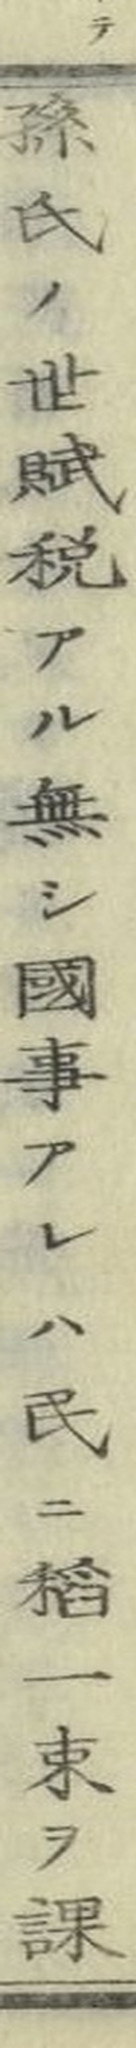孫氏ノ世賦税アル無シ國事アレハ民ニ稲一束ヲ課
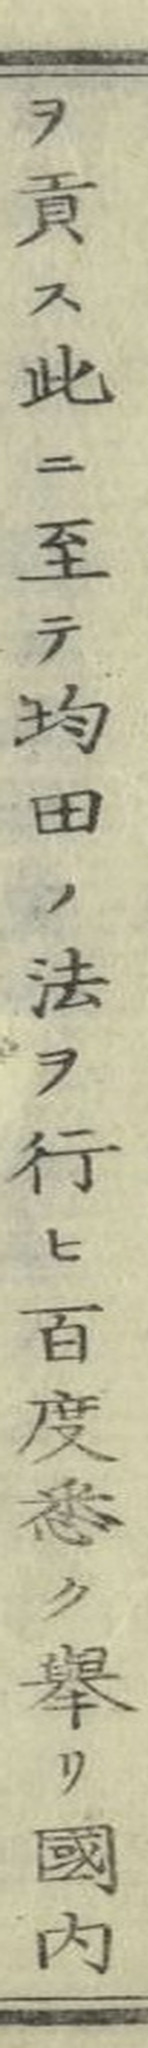ヲ貢ス此ニ至テ均田ノ法ヲ行ヒ百度悉ク舉リ國内
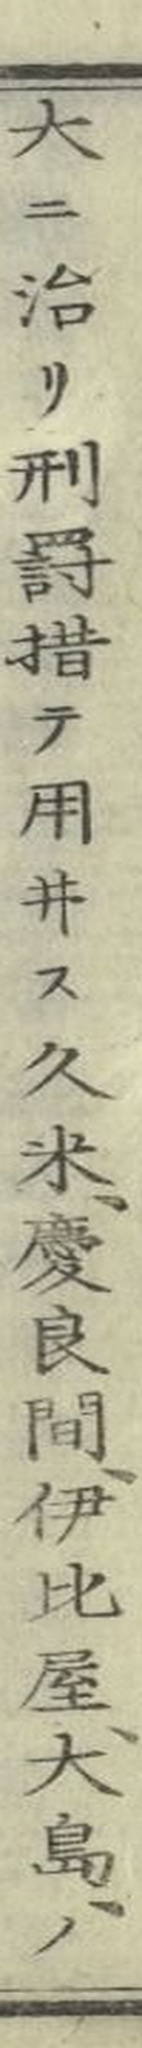大ニ治リ刑罰措テ用ヰス久米、慶良間、伊比屋、大島、ノ
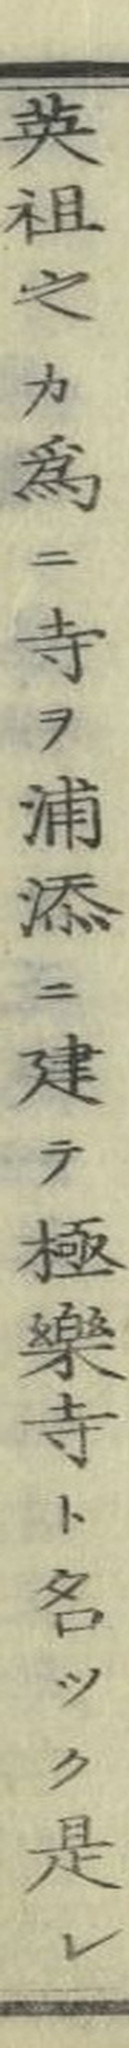英祖之カ爲ニ寺ヲ浦添ニ建テ極樂寺ト名ツク是レ

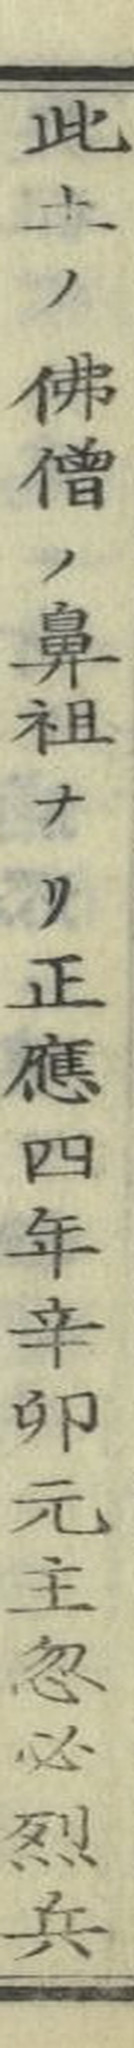此上ノ佛僧ノ鼻祖ナリ正應四年辛卯元主忽必烈兵
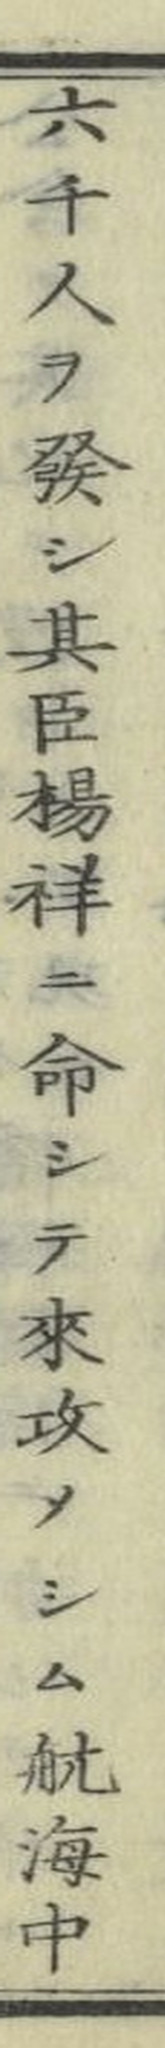六十人ヲシ其臣楊祥ニ命シテ來攻メシム航海中
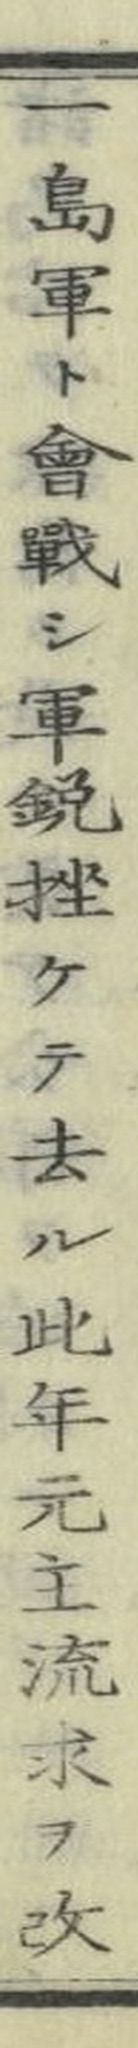一島軍ト會戰シ軍銳挫ケテ去ル此年元主流求ヲ改
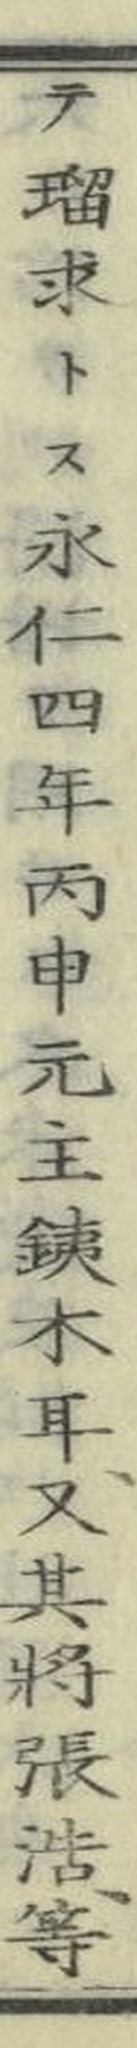テ瑠球トス永仁四年丙申元主銕木耳、又其將張浩、等
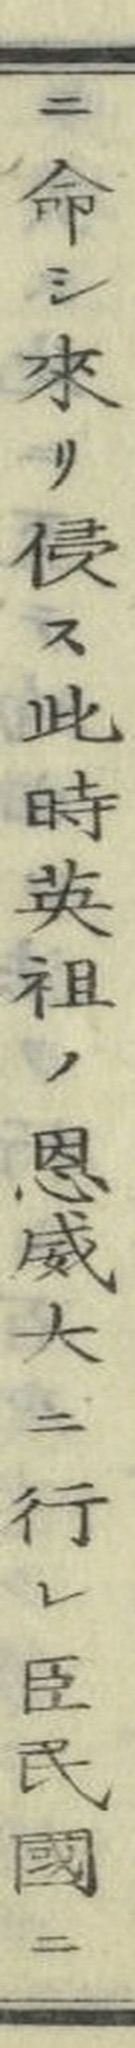ニ命シ來リ侵ス此時英祖ノ恩威大ニ行レ臣民國ニ
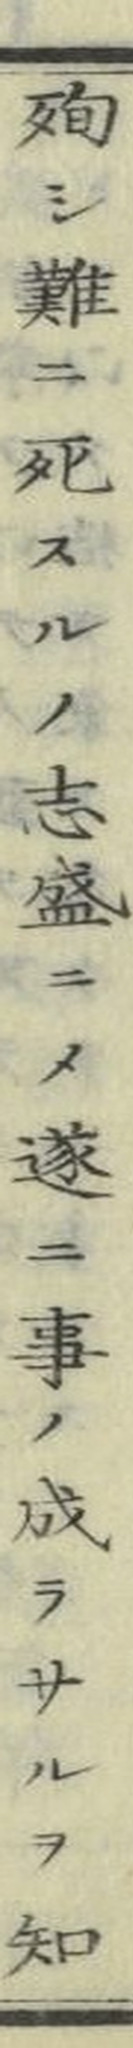殉シ難ニ死スルノ志盛ニシテ遂ニ事ノ成ラサルヲ知
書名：琉球藩史 一之巻
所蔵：University of the Ryukyus Library
